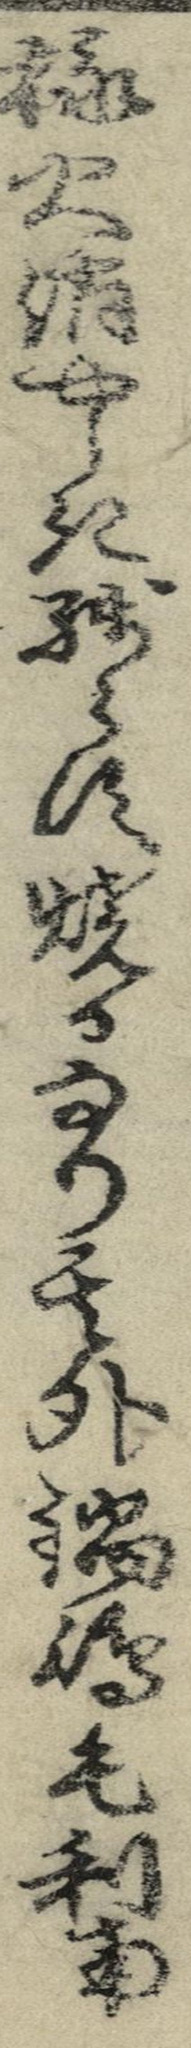様火消やき残らす焼るなり其外鍋嶋毛利南
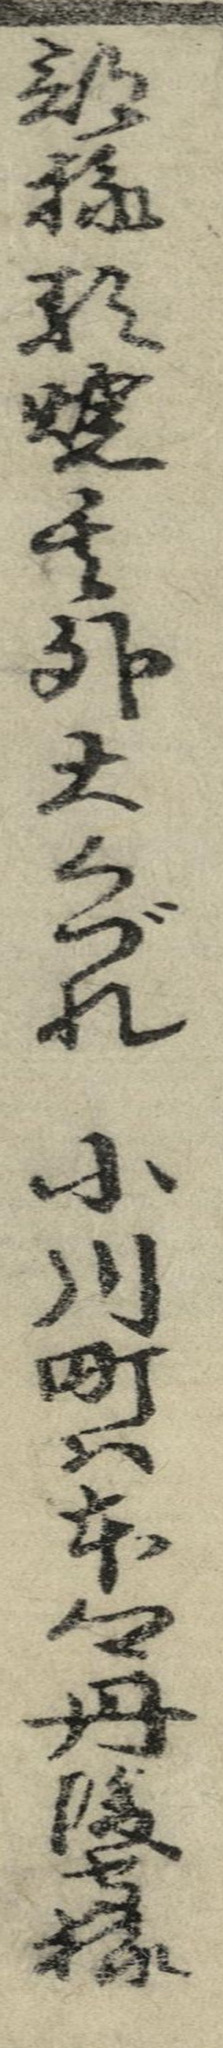部様類焼其外大くづれ小川町ハ本郷丹後守様
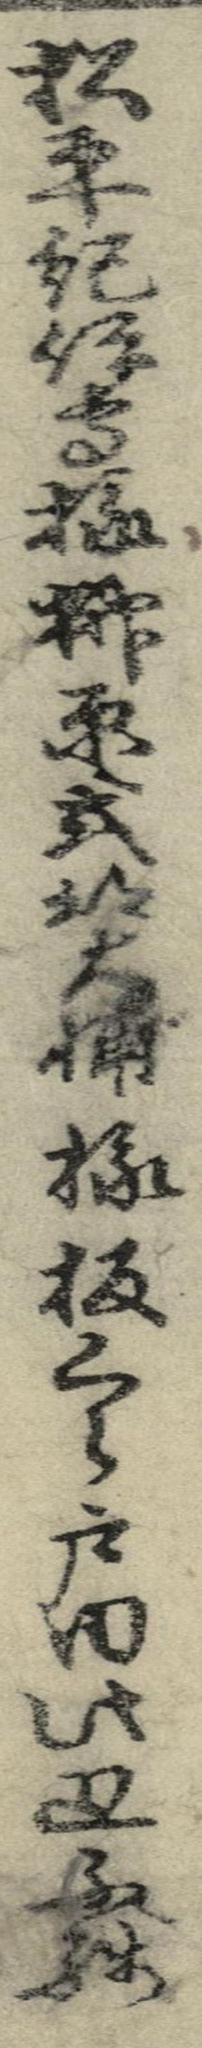松平紀伊守様榊原式部大輔様板くら戸田此辺不残
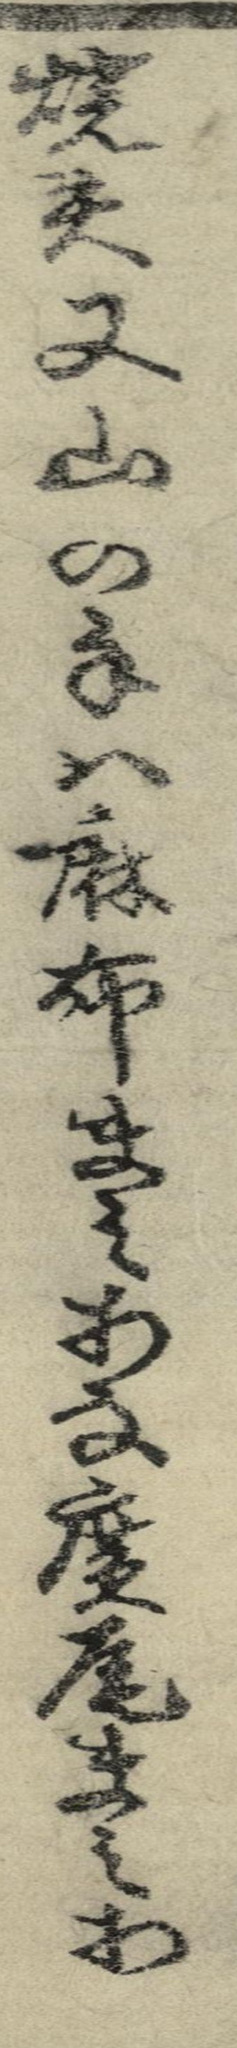焼失又山の手ハ麻布まミあな廣尾まミあ
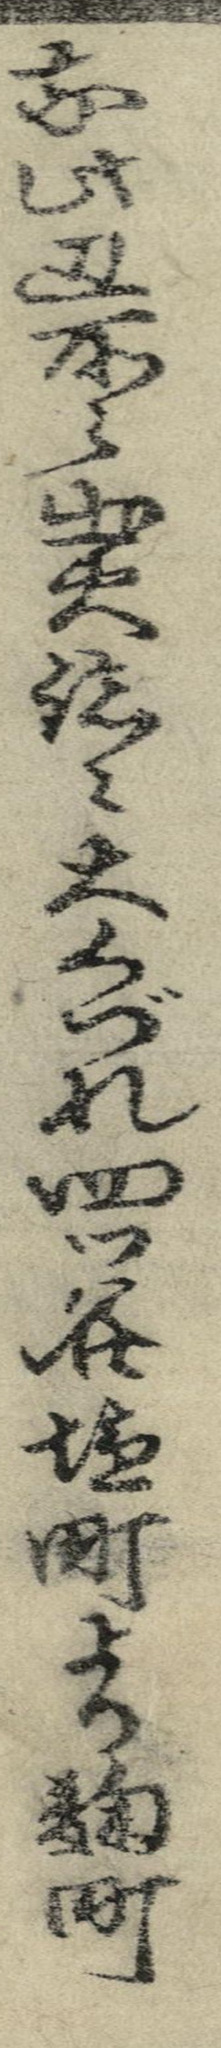な此辺所々出火諸々大くづれ四ツ谷塩町より麹町
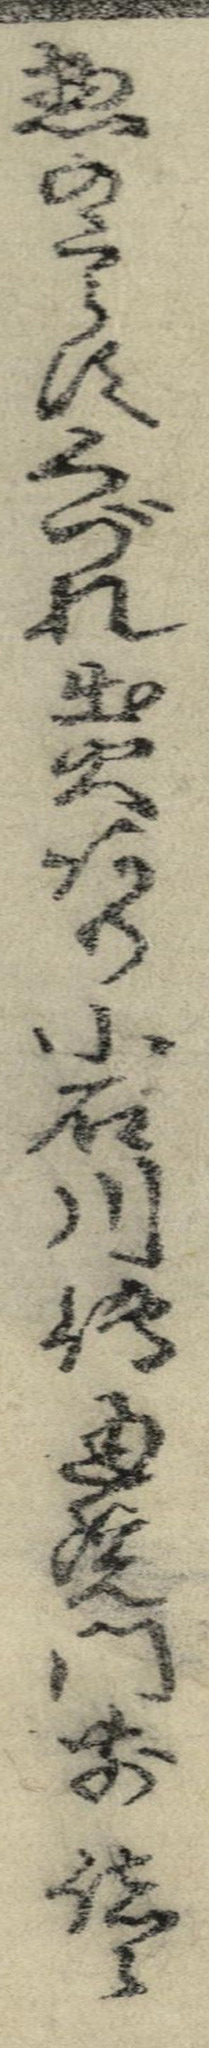惣のこらすくづれ出火あり小石川伝通院門前諸々
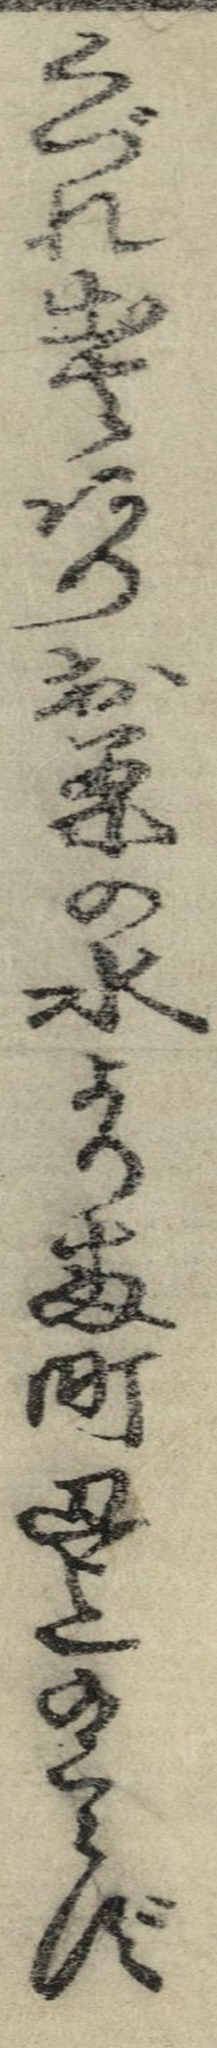くづれ出火あり御茶の水より番町辺迄のこらず
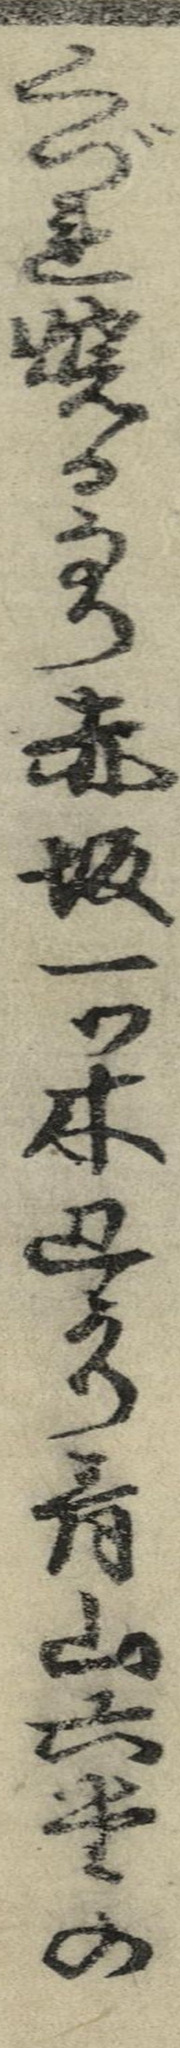くづれ焼るなり赤坂一の木辺より青山六堂の猿若丁
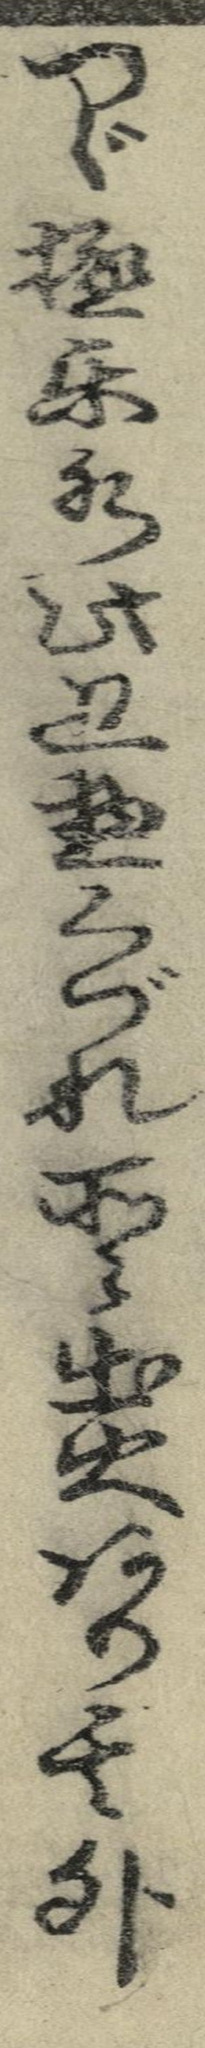つじ極楽水此辺惣くづれ所々出火あり其外三芝居
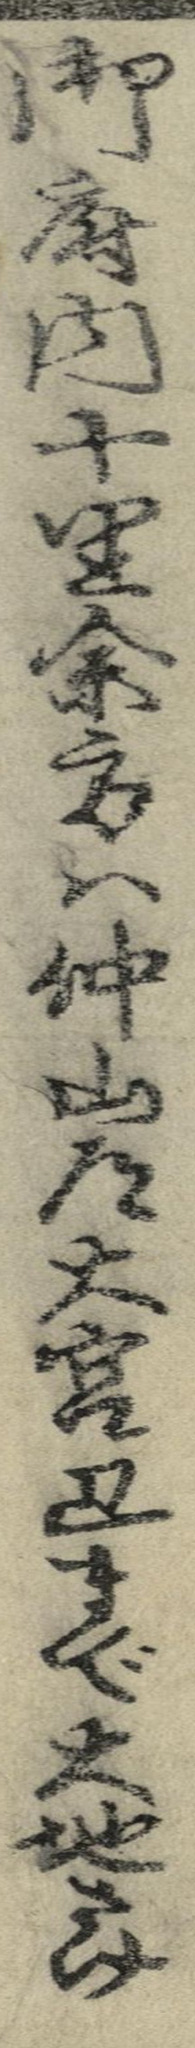御府内十里余方ハ仲山道大宮辺まで大地さけ
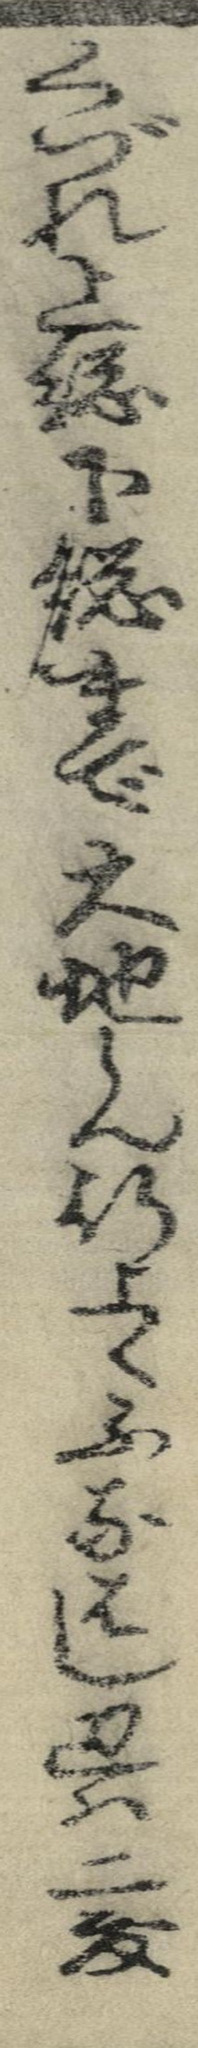くづれ上総下総まで大地しん行上へふなはし辺ハ二度
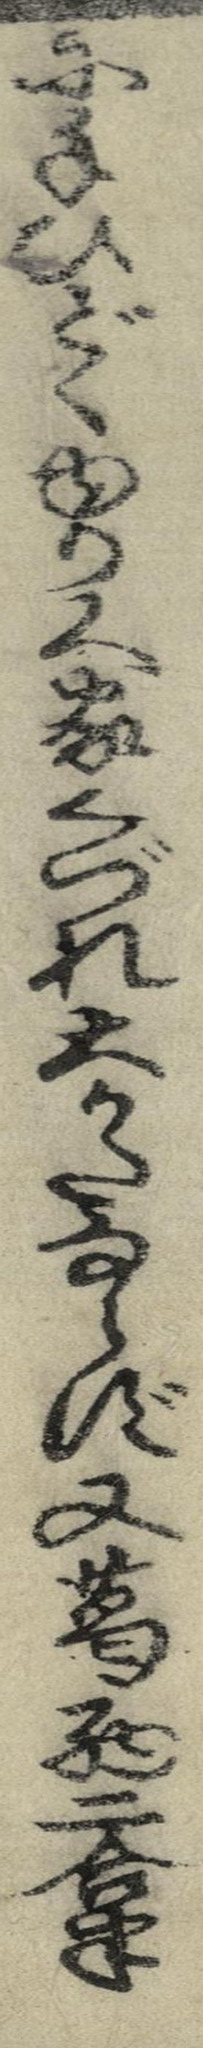に手ひどくゆり人家くずれ大かたならず又葛西二合半
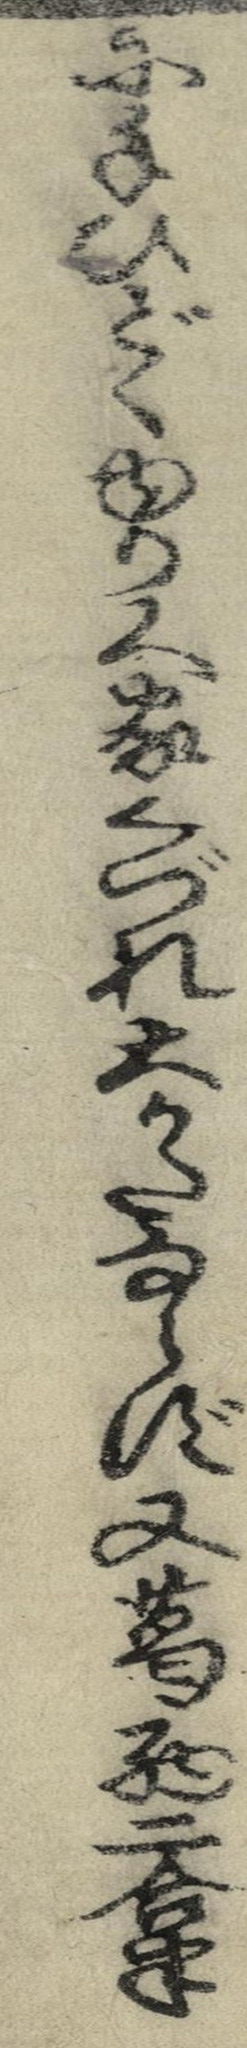に手ひどくゆり人家くずれ大かたならず又葛西二合半
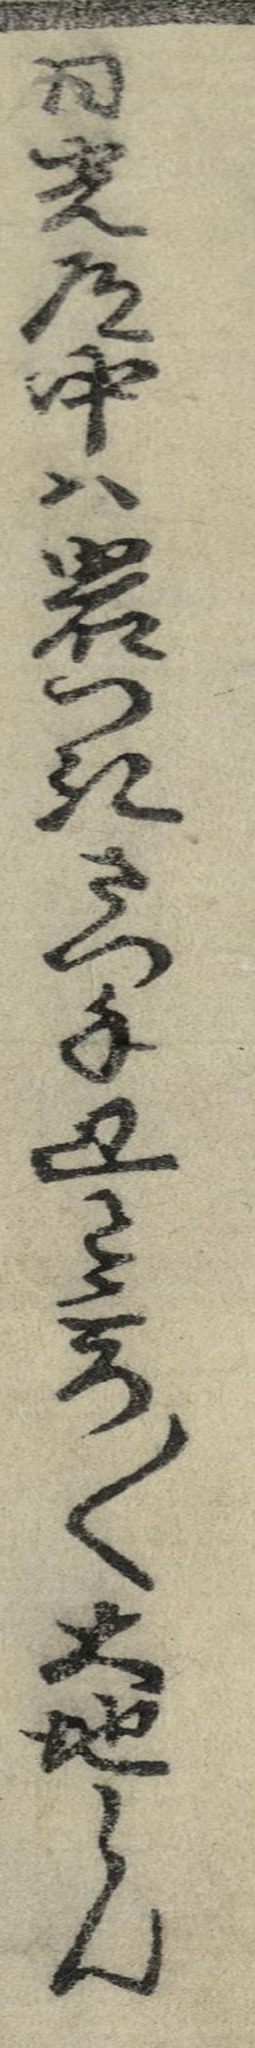日光道中ハ岩つきさい手辺ところ〳〵大地しん
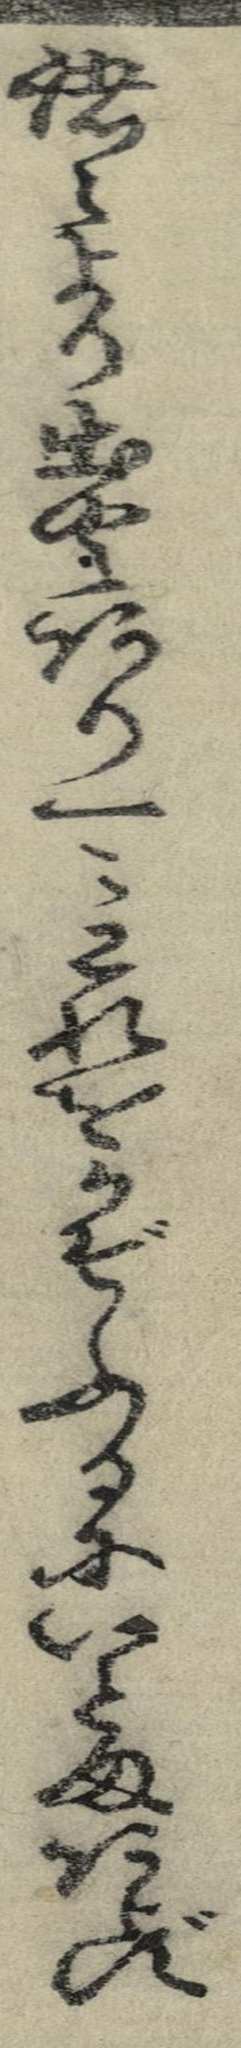諸々より出火あり一々かぞふるにいとまあらず
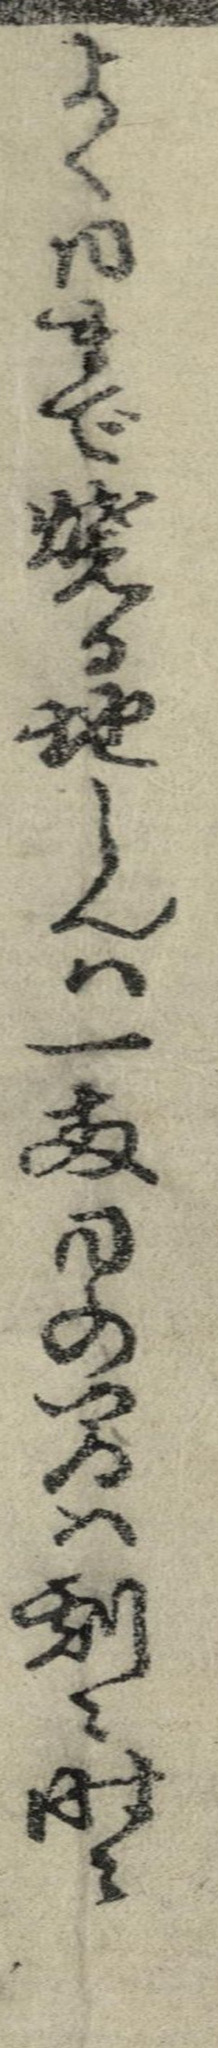よく日まで焼る地しんハ一両日の間ハ刻々時々
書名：江戸大地震并出火場所極本しらべ
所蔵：東京大学地震研究所図書室 Earthquake Research Institute Library, The University of Tokyo, JAPAN
